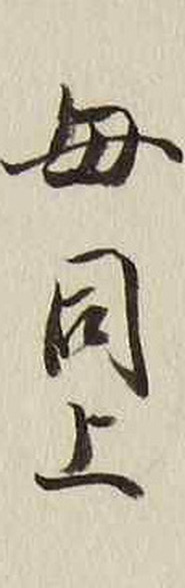母同上
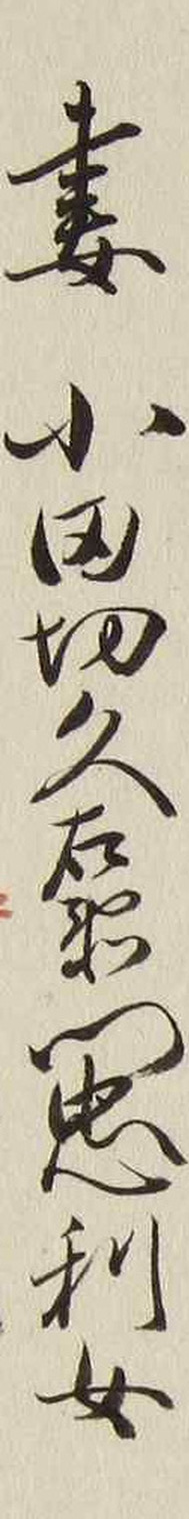妻小田切久右衛門忠利女
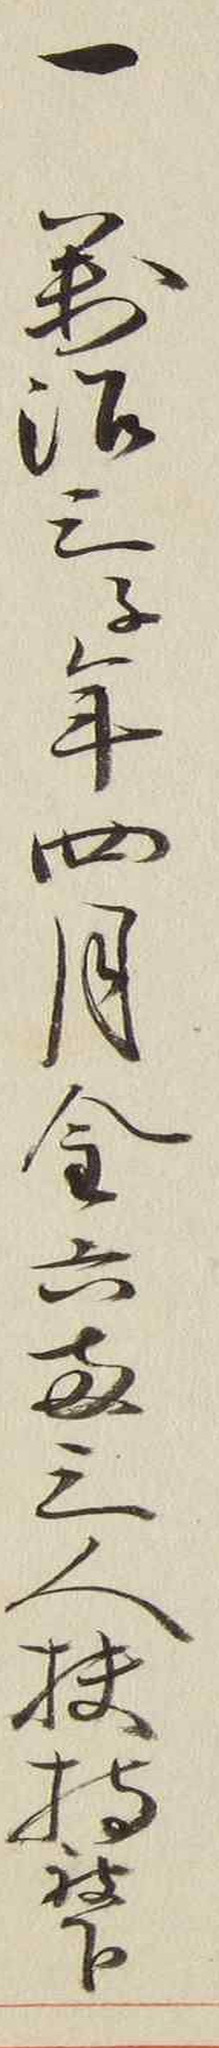一万治三子年四月金六両三人扶持被下

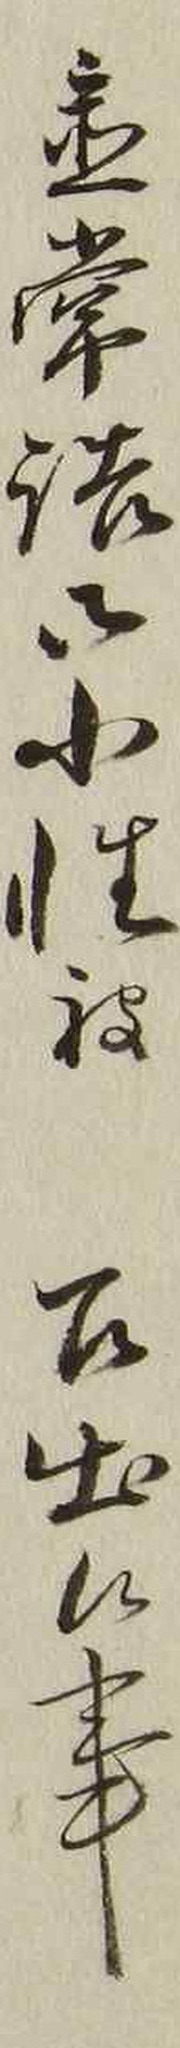置常詰御小性被召出候事
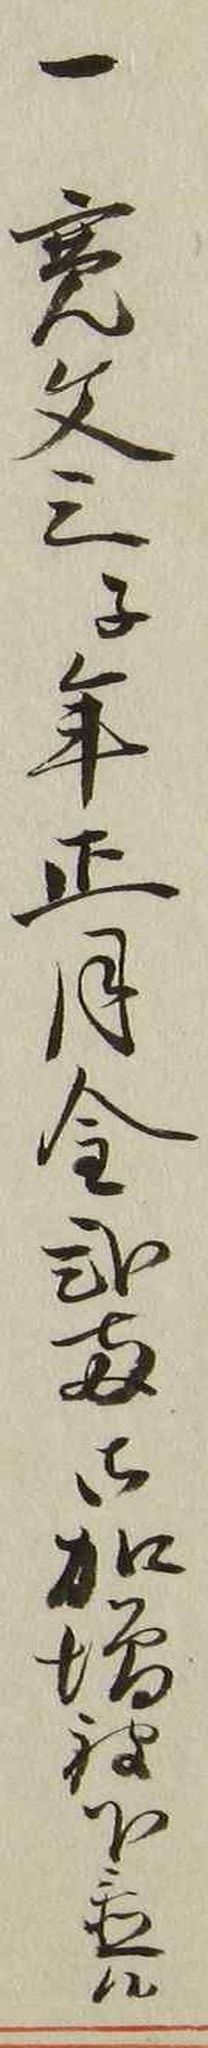一寛文三子年正月金二両御加増被下置候
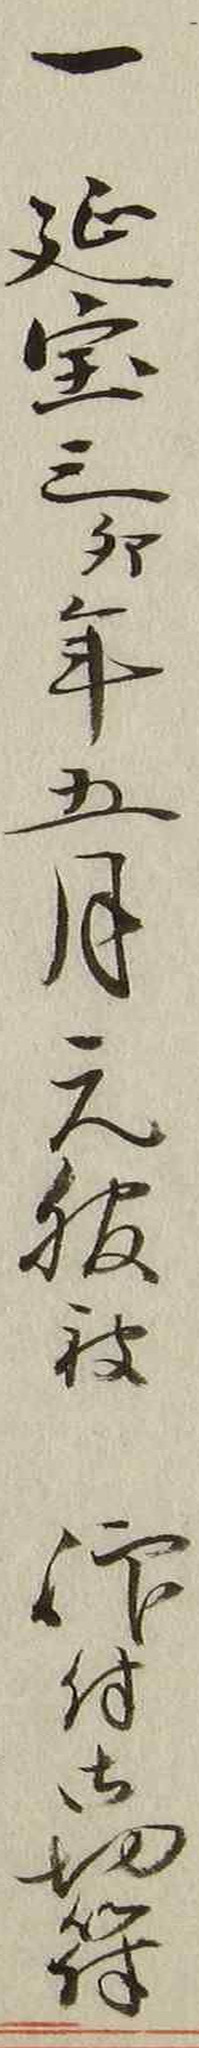一延宝三卯年五月元服被仰付御切符
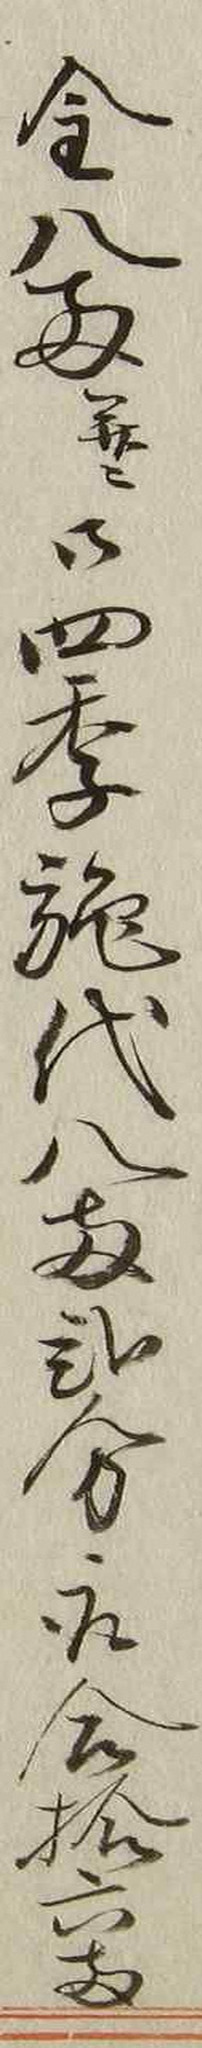金八両幷ニ御四季施代八両弐分取合拾六両
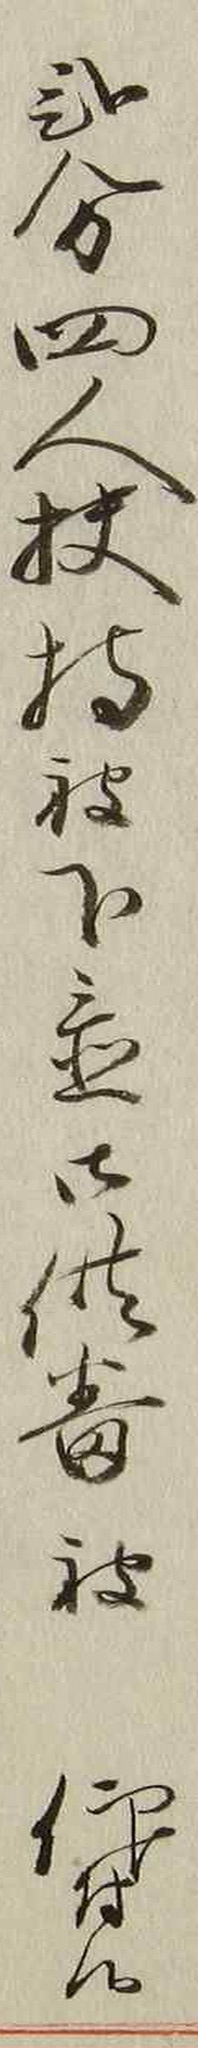弐分四人扶持被下置御供番被仰付候
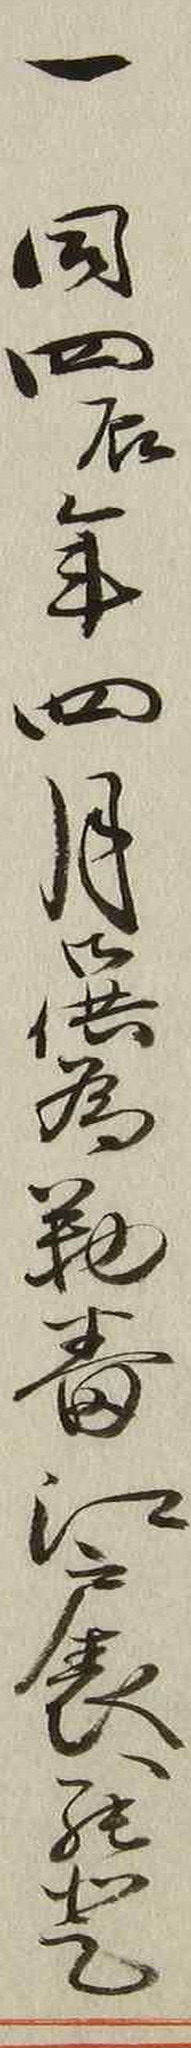一同四辰年四月御供為勤番江戸表ㇸ罷登
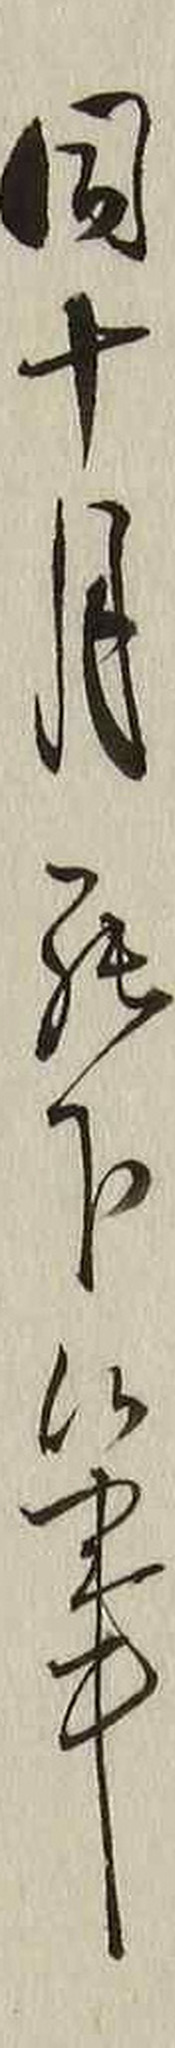同十月罷下候事
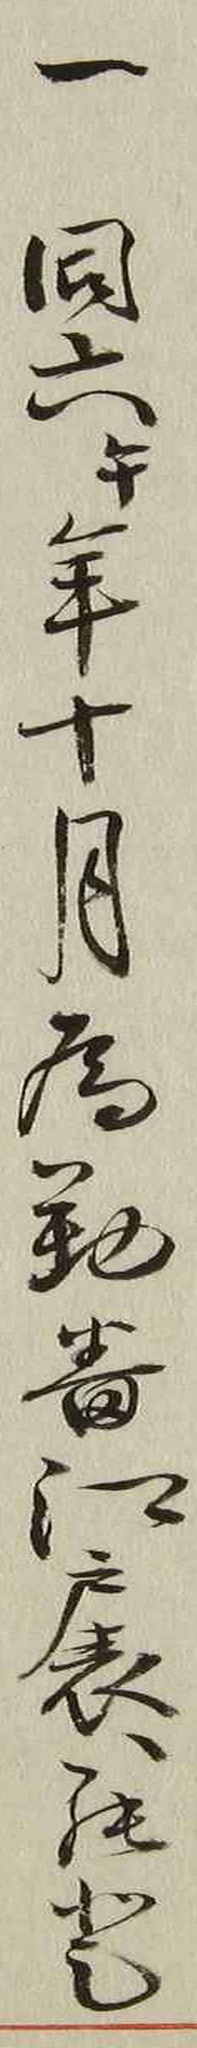一同六午年十月為勤番江戸表ㇸ罷登
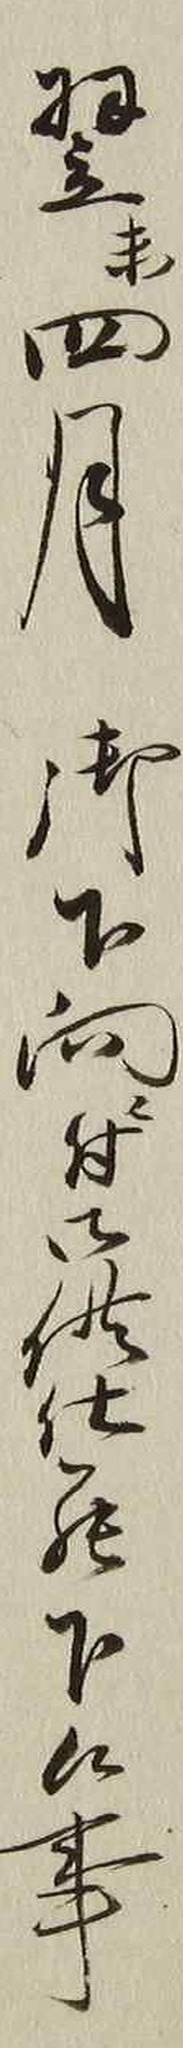翌未年四月御下向ニ付御供仕罷下候事
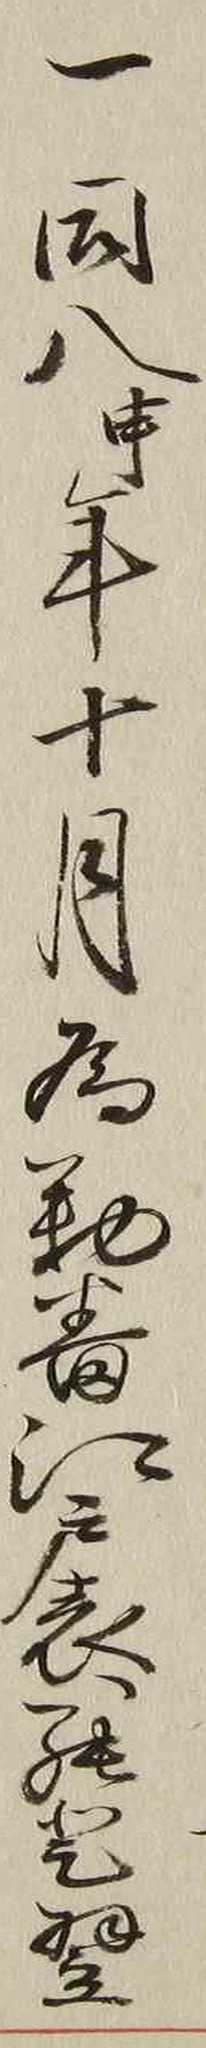一同八申年十月為勤番江戸表ㇸ罷登翌
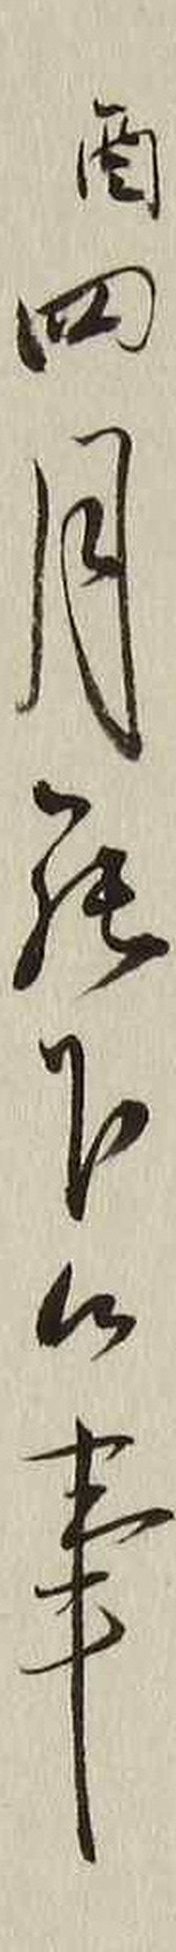酉四月罷下候事
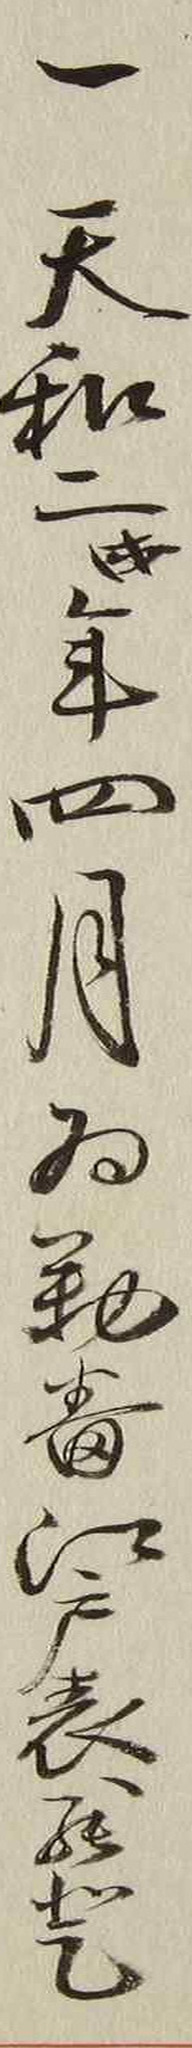一天和二戌年四月為勤番江戸表ㇸ罷登
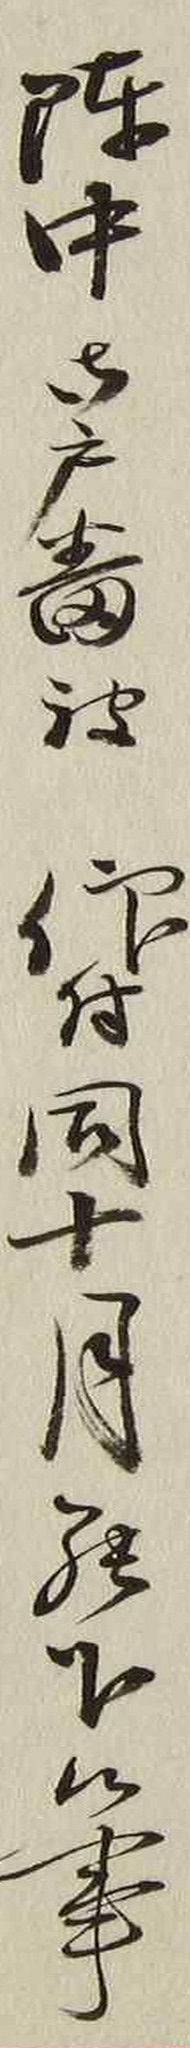陣中御戸番被仰付同十月罷下候事
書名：諸士系譜　巻之163　な之部5
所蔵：会津若松市立会津図書館
